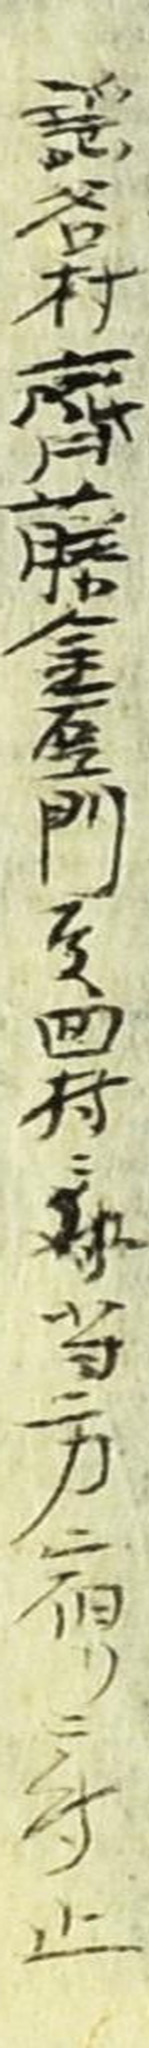謡谷村斉藤金右ヱ門殿回村ニ付当方宿リニ付止
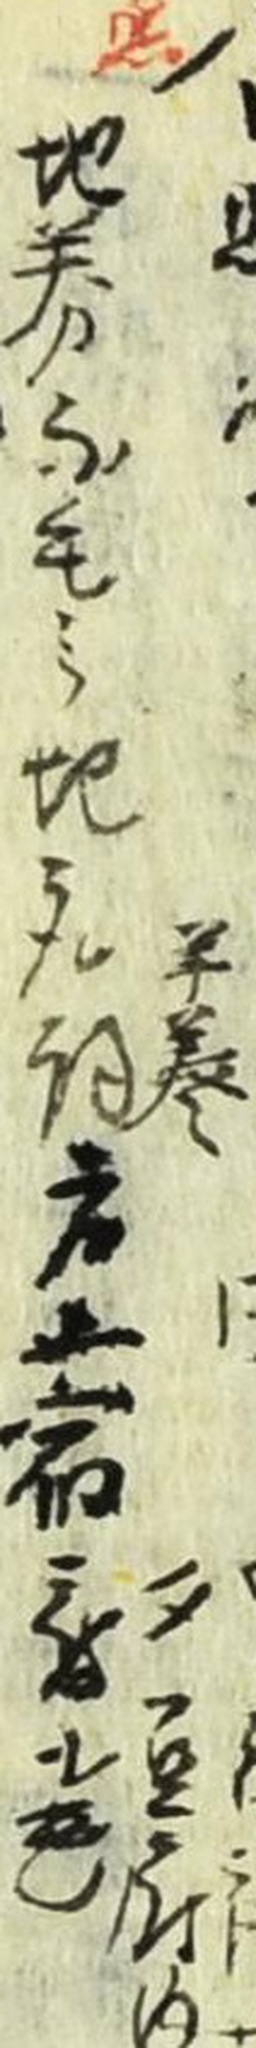地券不毛之地取調者止宿ニ付
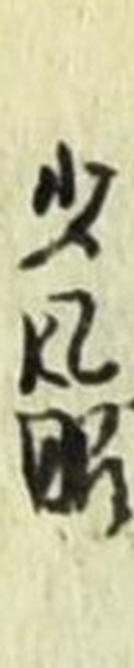少風昭
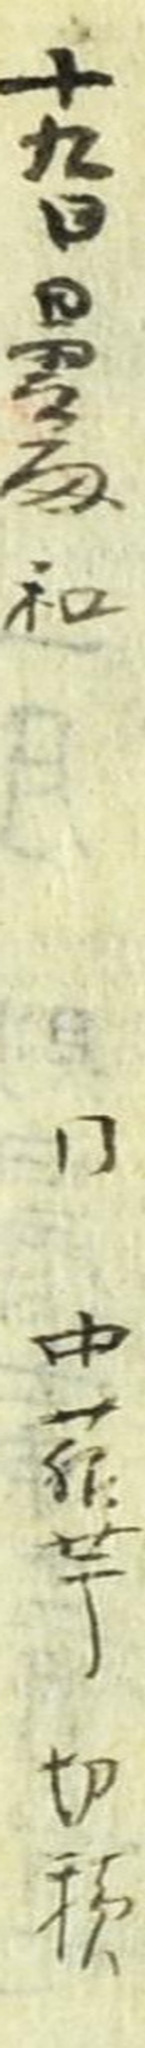十九日曇雨和同中菔芋切積
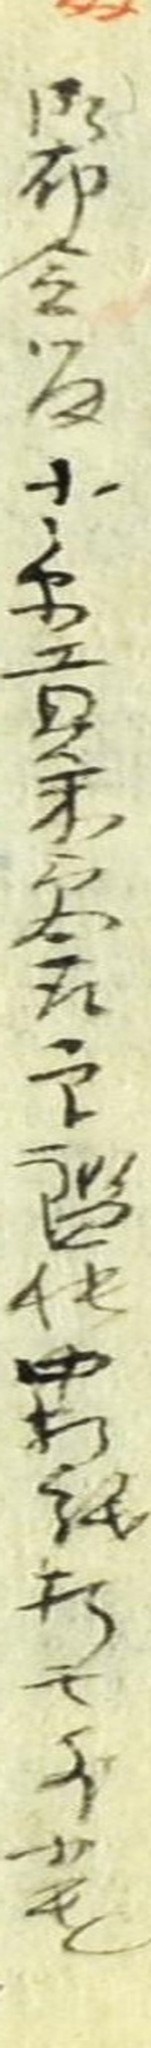御布令留小兵衛貢米受取印鑑帳中折紙折其外小遣

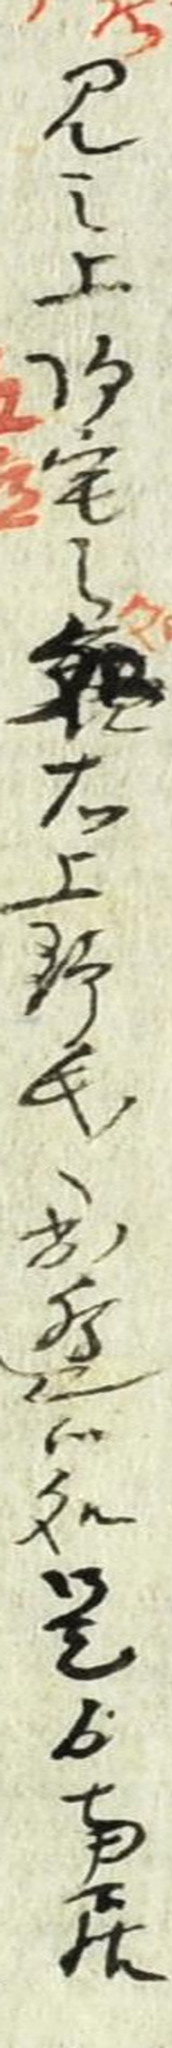見之上帰宅之処右上野氏へ出逢候処是ゟ南居
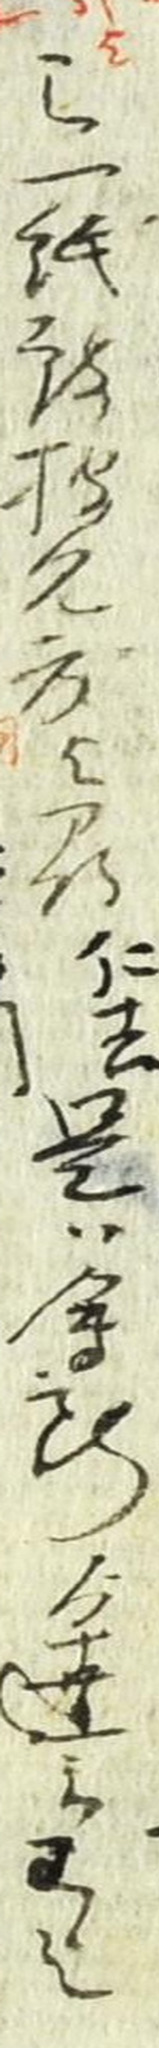之一紙致披見方与尋仁吉是ハ会所ゟ達ニ而有之
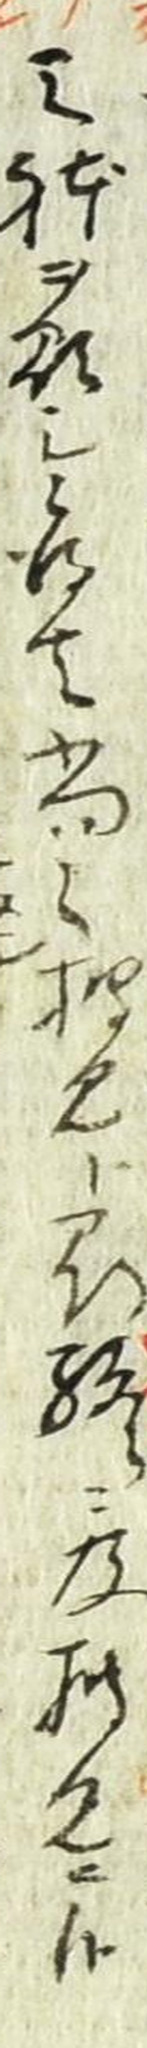之体ヲ顕シ候得者尚々披見ト尋終ニ及披見ニ候
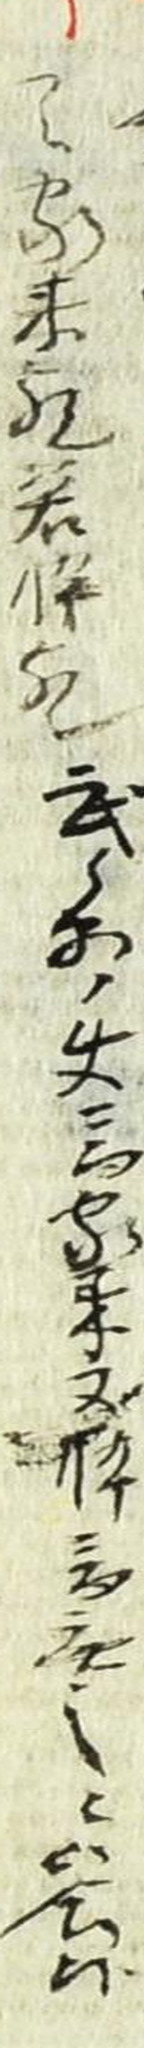之家来歟若倅歟武兵衛ノ使ニ而家来又倅ニ而無之与答候
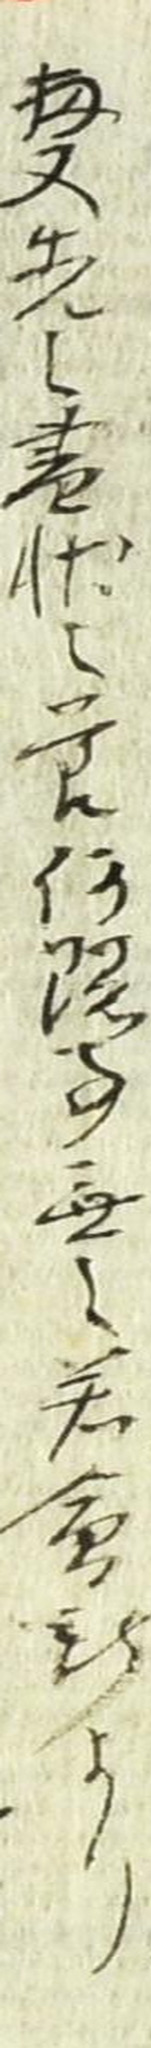扨又先之書状之節何隠事無之若会所より
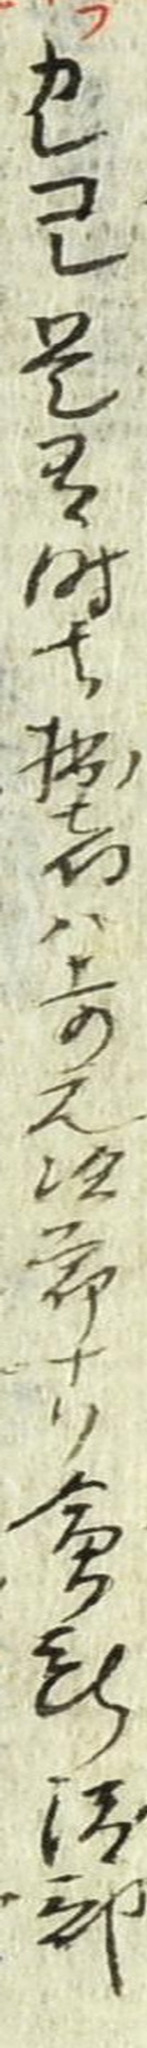カレコレ是有時者拙者ハ上の元次郎ナリ会所渡部
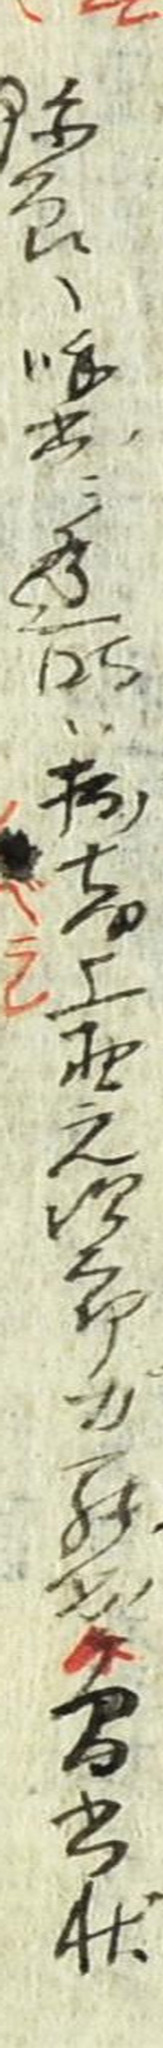珍良へ呼出ニ逢時ハ拙者上野元次郎ガ罷出「候」間書状
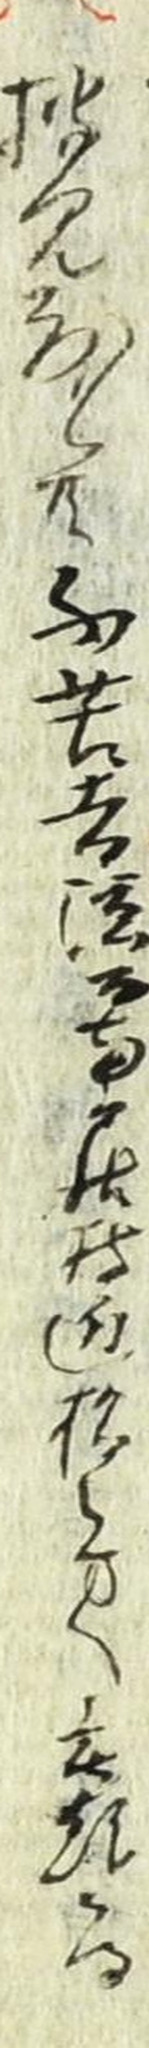披見致候共不苦旨演而南居村近橋之方へ被趣候向
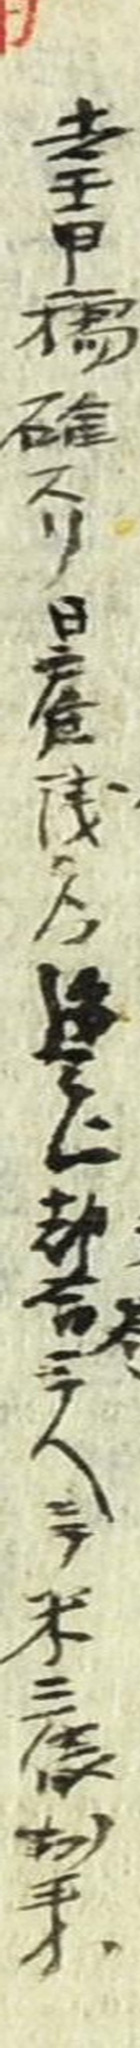去壬申糯碓スリ日雇浅右衛門弥三右衛門都合三人ニテ米三俵出来
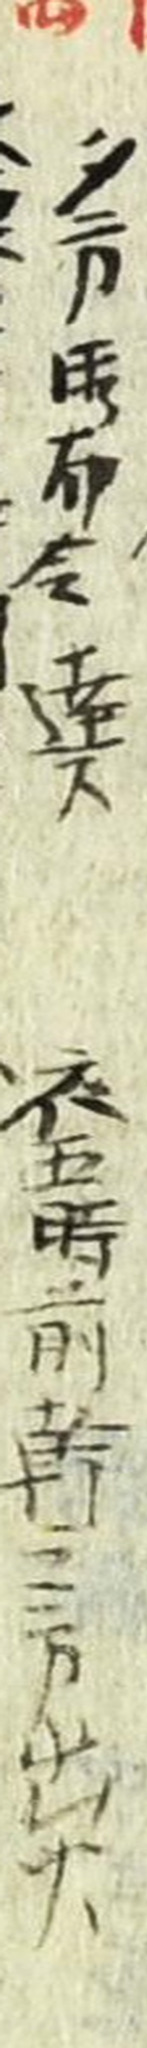夕方御布令達ス夜五時前乾之方出火
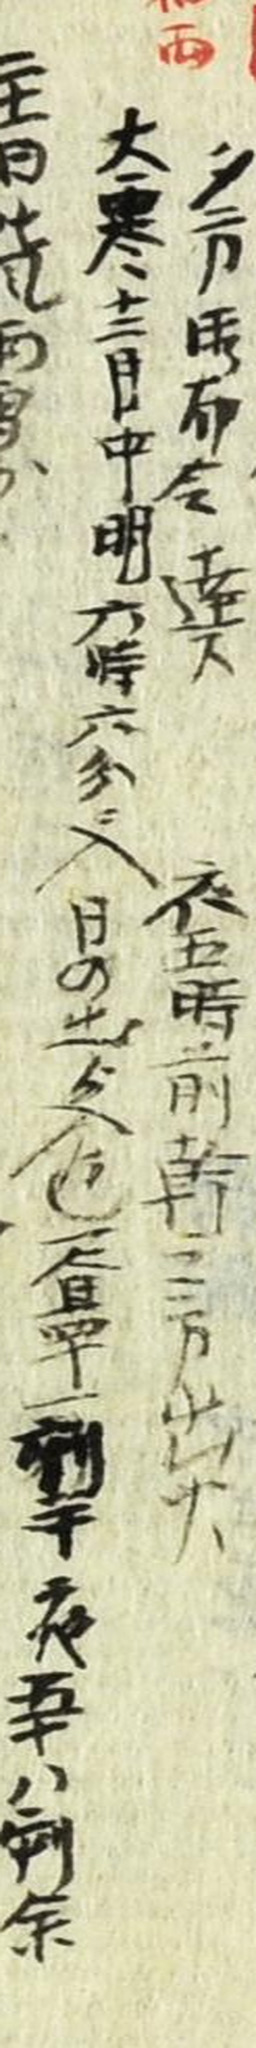大寒十二月中明六時六分ニ入日の出ゟ入迄昼四十一刻半夜五十八刻半余
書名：（日記）
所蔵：福井県文書館 Fukui Prefectural Archives
